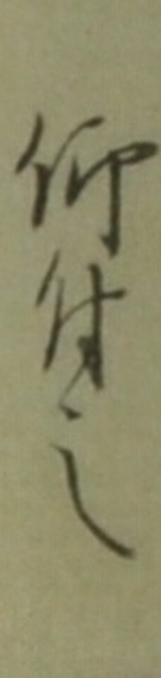仰付之

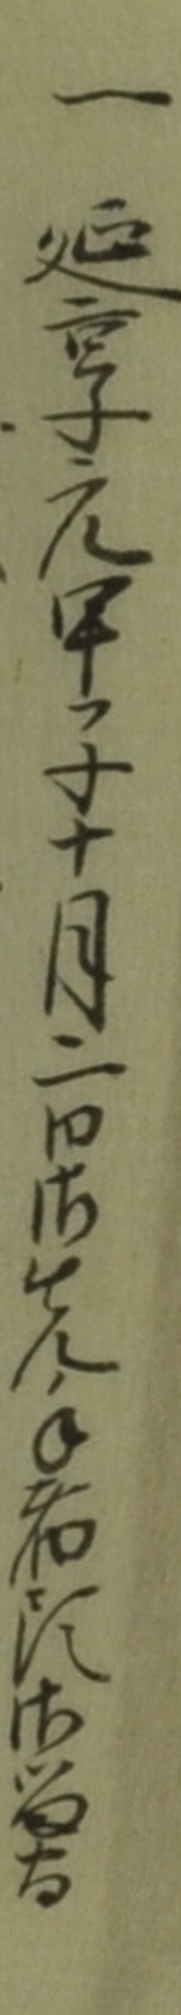一延享元甲子十月二日御先手者頭御留守
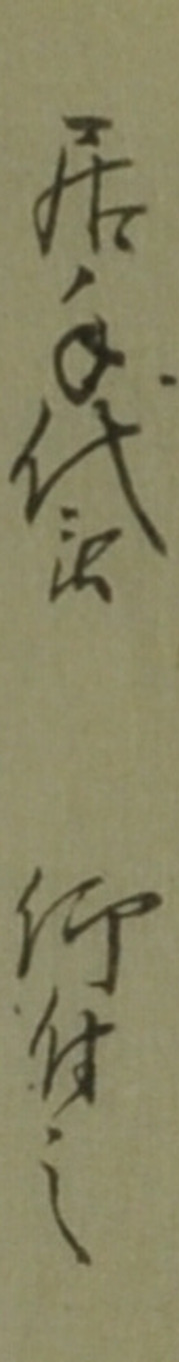居手代被仰付之
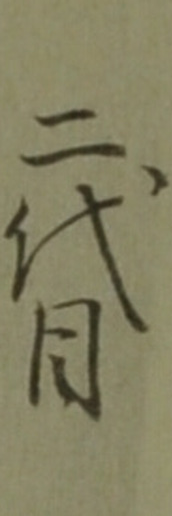二代目
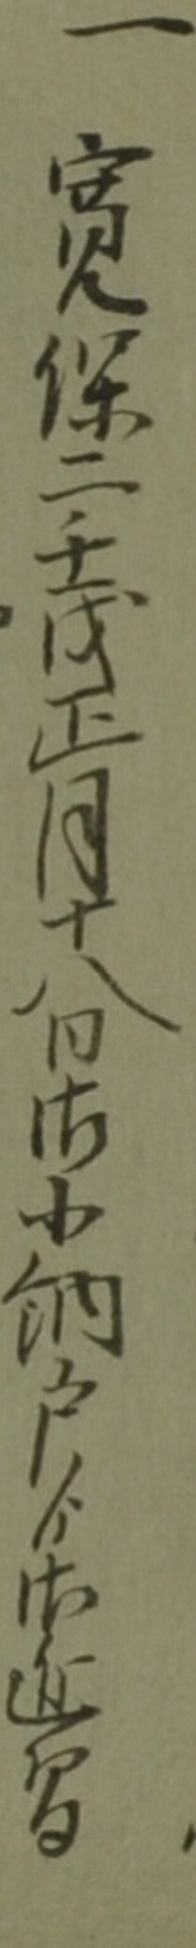一寛保二壬戌正月十八日御小納戸ゟ御近習
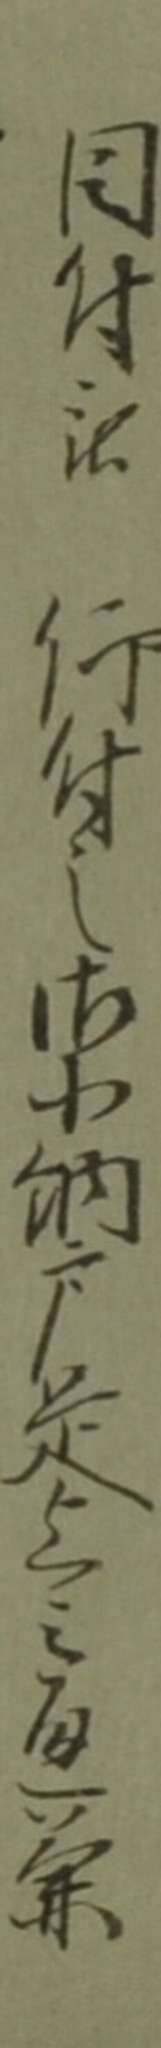目付被仰付之御小納戸是迄之通兼
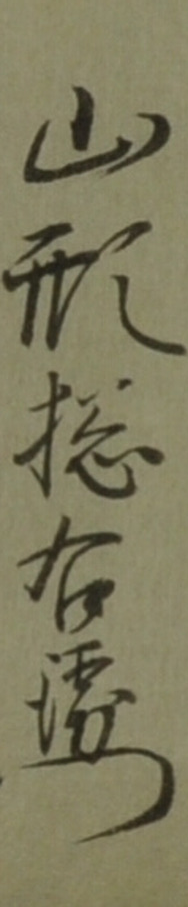山形捴右衛門
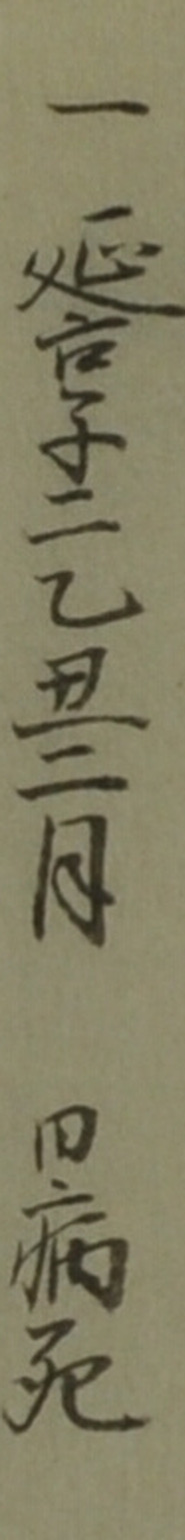一延享二乙丑二月日病死
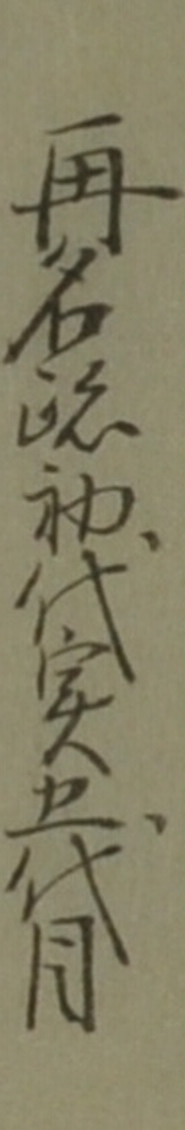再名跡初代実五代目
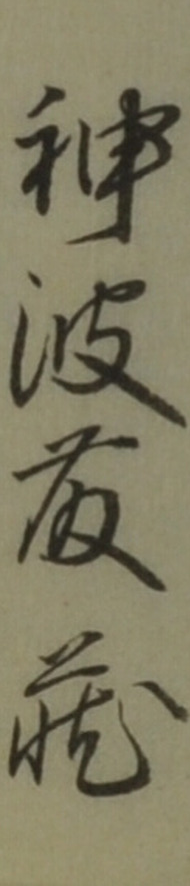神波藤蔵
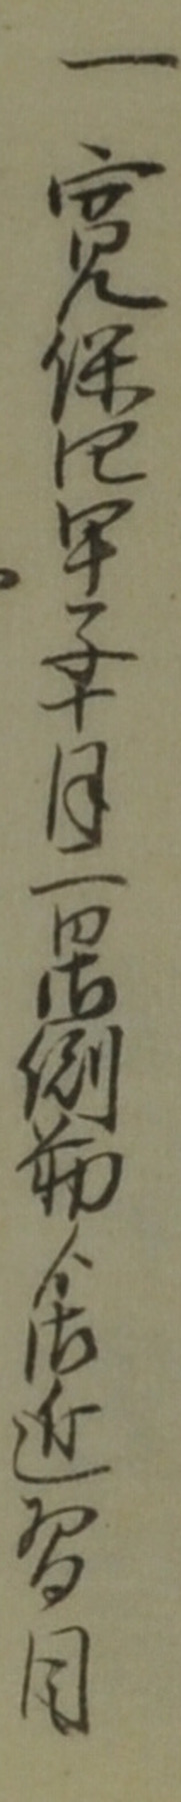一寛保四甲子十月二日御側勤ゟ御近習目
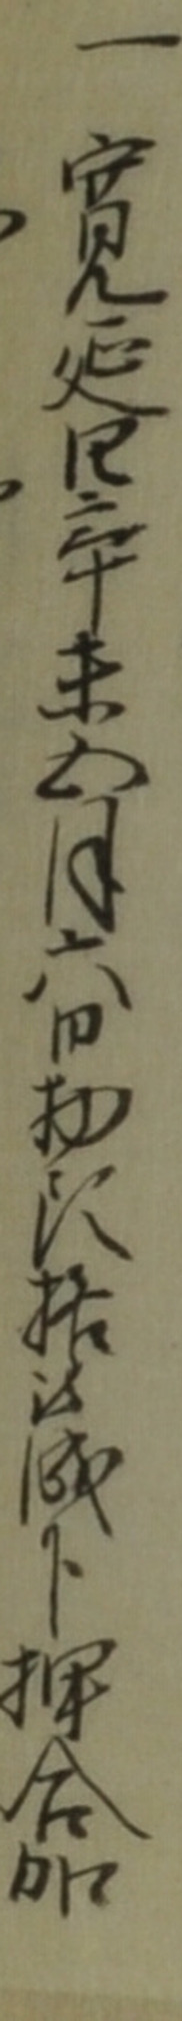一寛延四辛未五月六日物頭格被成下押合加
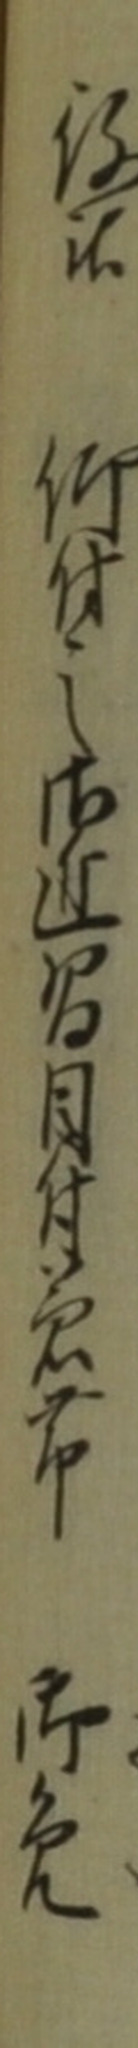役被仰付之御近習目付兼帯御免
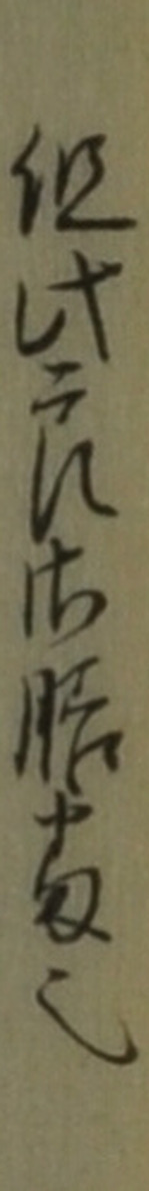但此節御膳番也
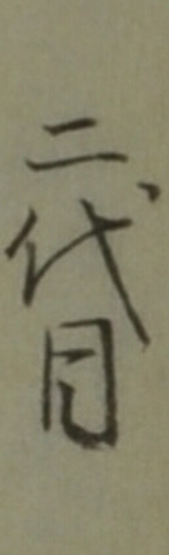二代目
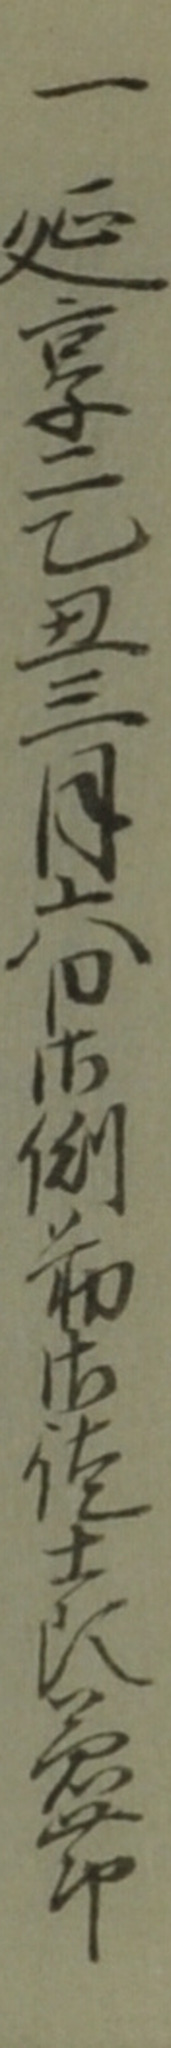一延享二乙丑三月六日御側勤御徒士頭兼帯
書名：諸御役代々録（四）
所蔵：伊那市立高遠町図書館・合同会社AMANE
